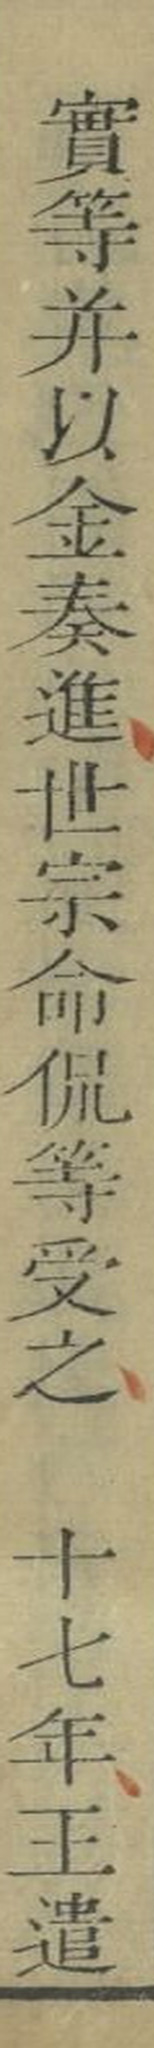実等并以金奏進世宗命侃等受之十七年王遣
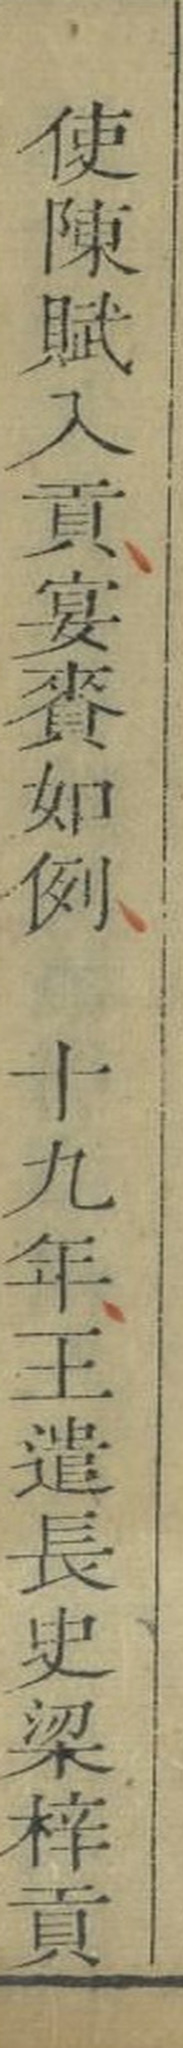使陳賦入貢宴賚如例十九年王遣長史梁梓貢
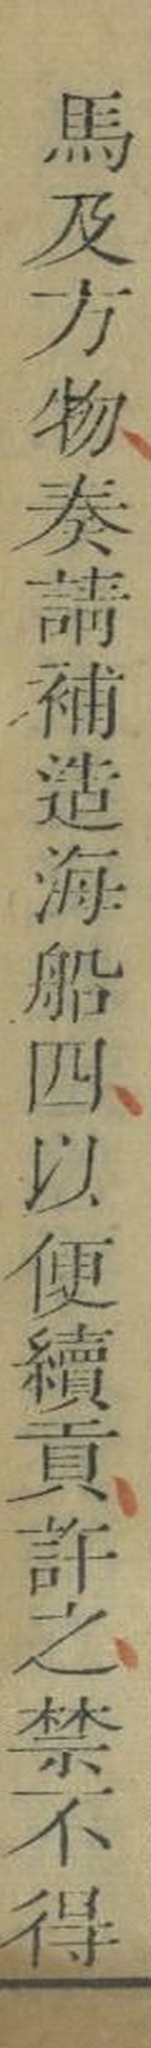馬及方物奏請補造海船四以便続貢許之禁不得

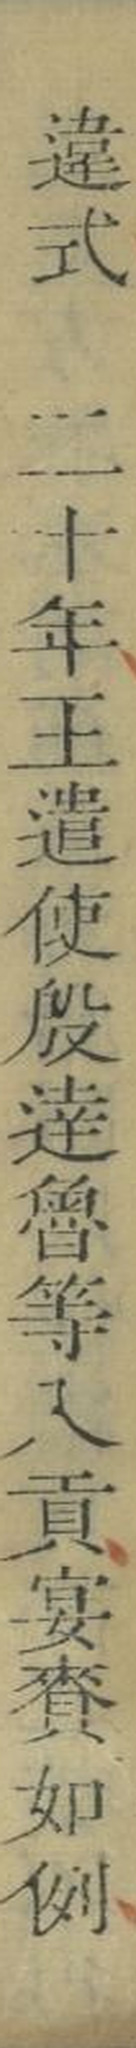違式二十年王遣使殷達魯等入貢宴賚如例
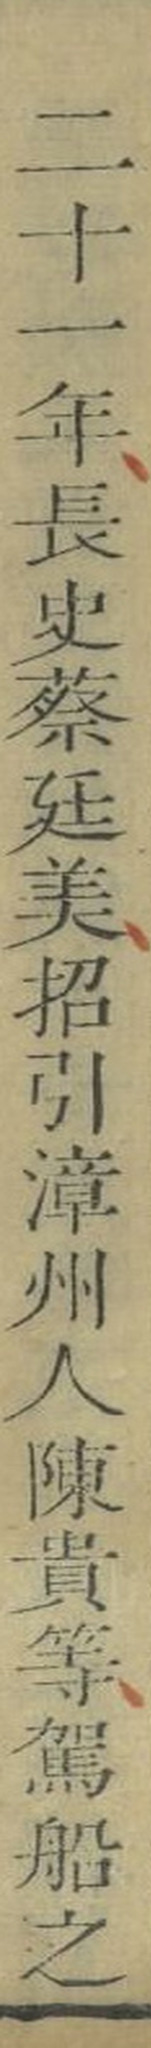二十一年長史蔡廷美招引漳州人陳貴等駕船之
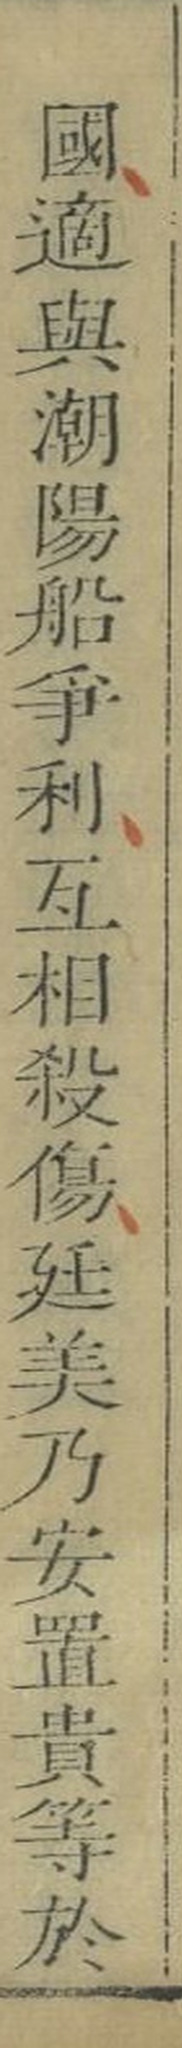国適与潮陽船争利互相殺傷廷美乃安置貴等於
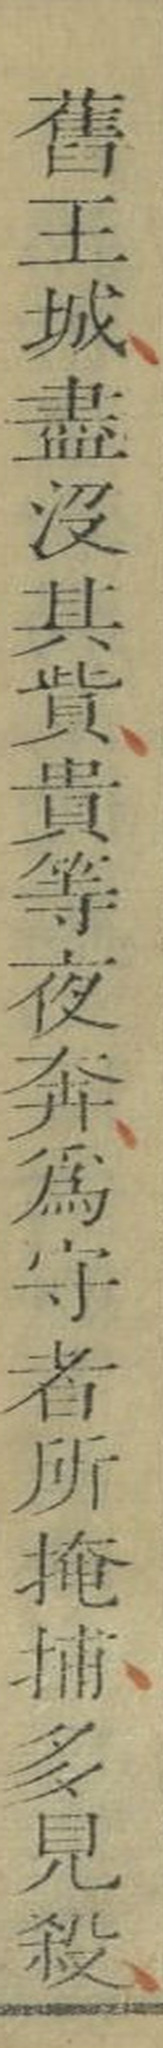旧王城尽没其貲貴等夜奔為守者所掩捕多見殺
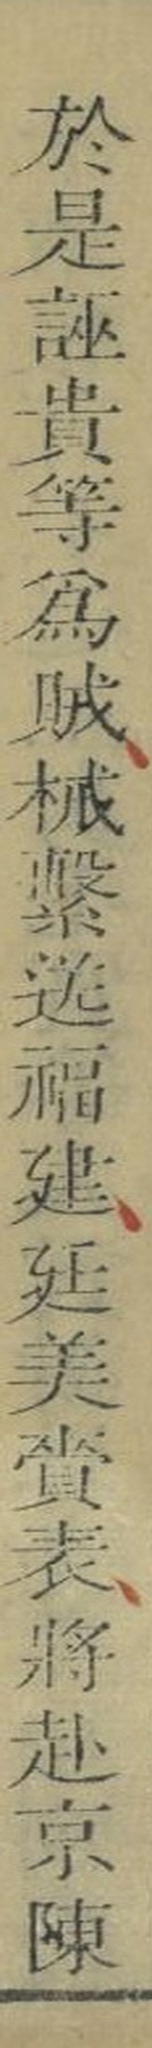於是誣貴等為賊械繋送福建廷美賚表将赴京陳
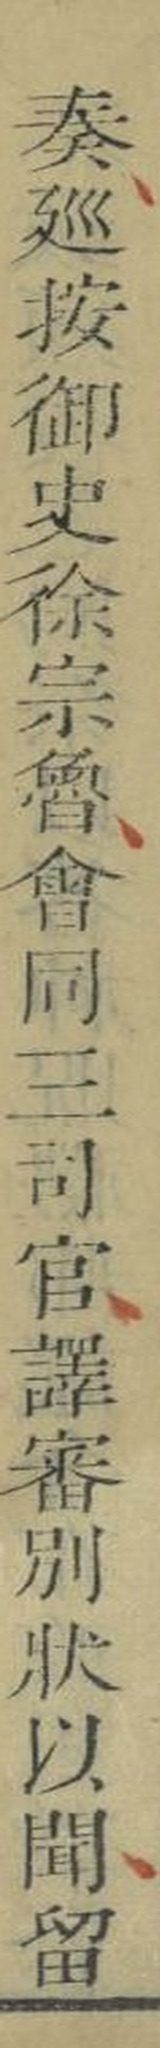奏巡按御史徐宗魯会同三司官訳審別状以聞留
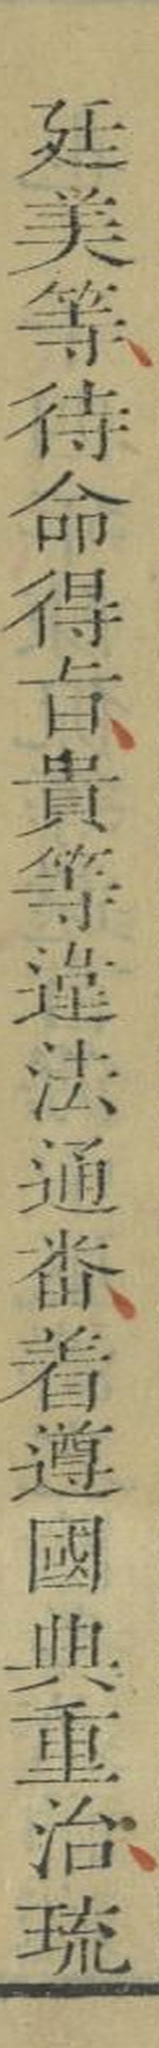廷美等待命得旨貴等違法通畨着遵国典重治琉
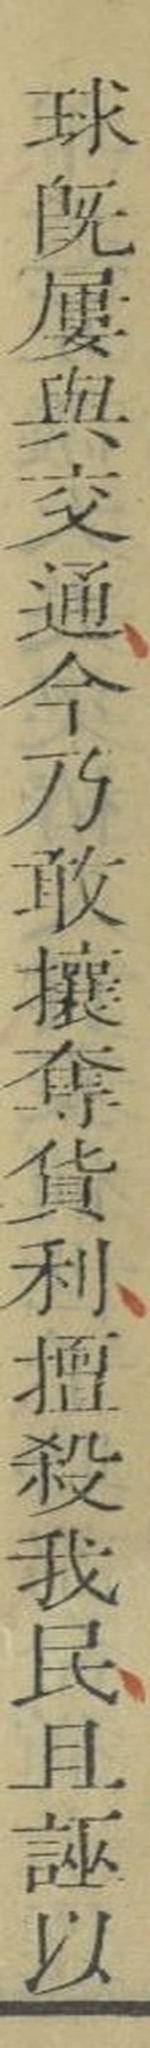球既屢与交通今乃敢攘奪貨利擅殺我民且誣以
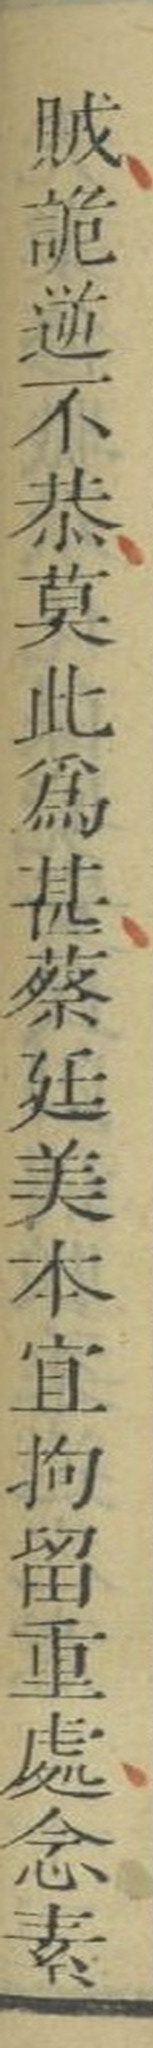賊詭逆不恭莫此為甚蔡廷美本宜拘留重処念素
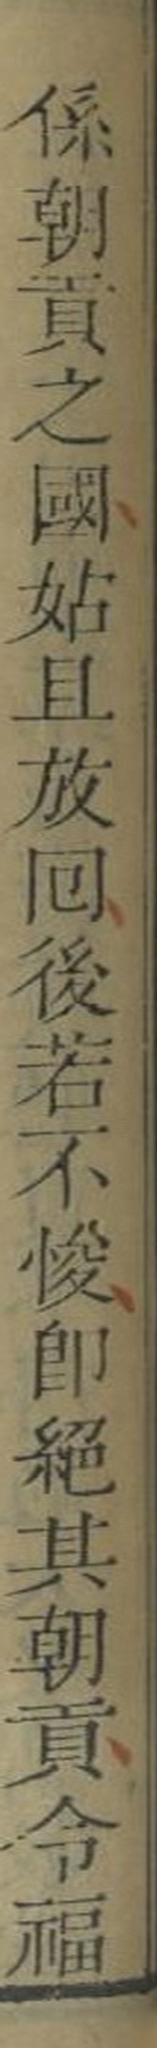係朝貢之国㚲且放回後若不悛即絶其朝貢令福
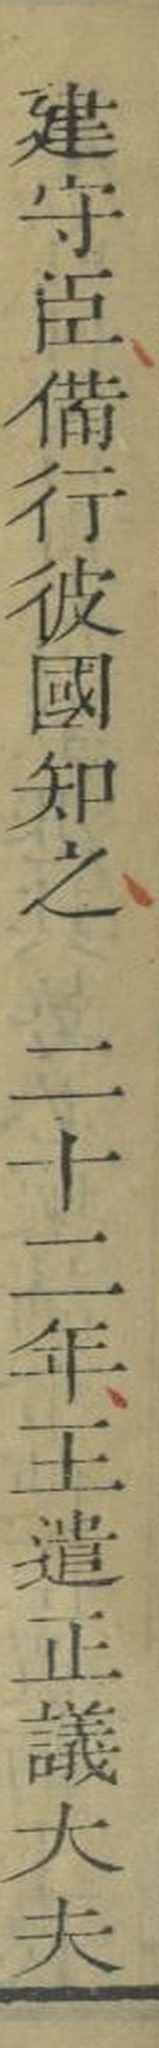建守臣備行彼国知之二十二年王遣正議大夫
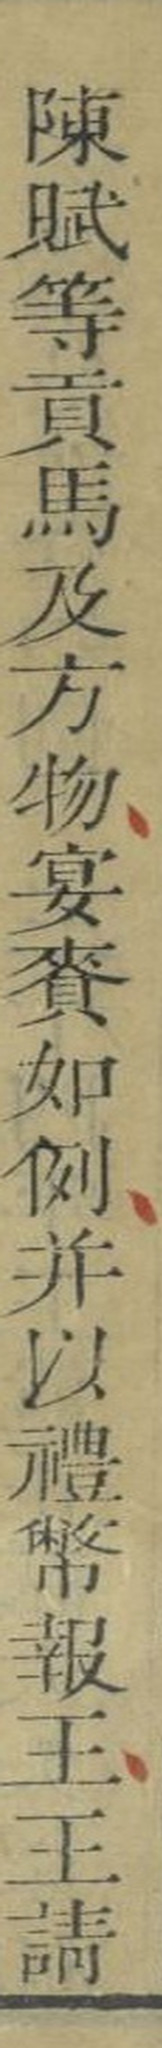陳賦等貢馬及方物宴賚如例并以礼幣報王王請
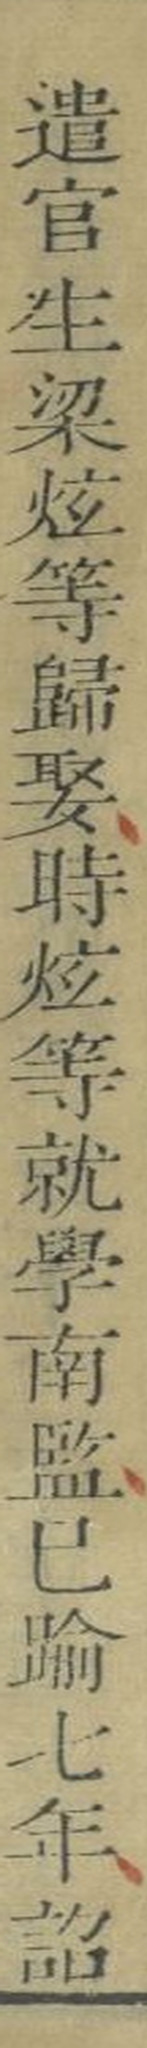遣官生梁炫等帰娶時炫等就学南監巳踰七年詔
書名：中山伝信録 巻三
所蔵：University of the Ryukyus Library
